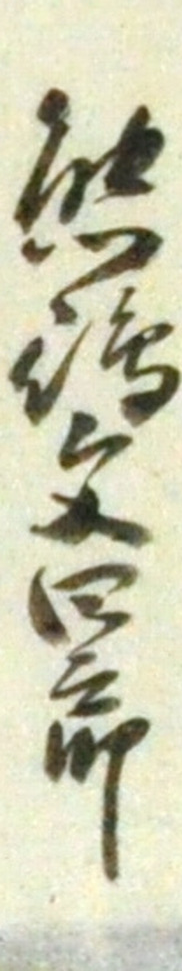熊島文四郎
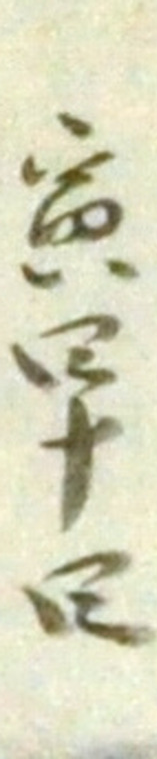寅四十四
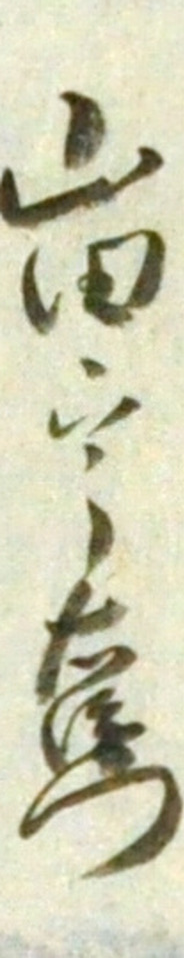山田宇右衛門
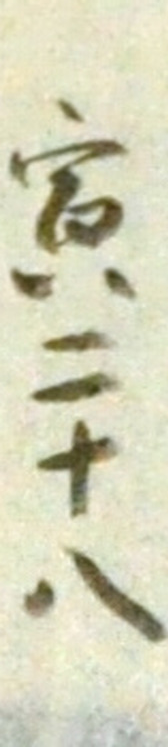寅二十八
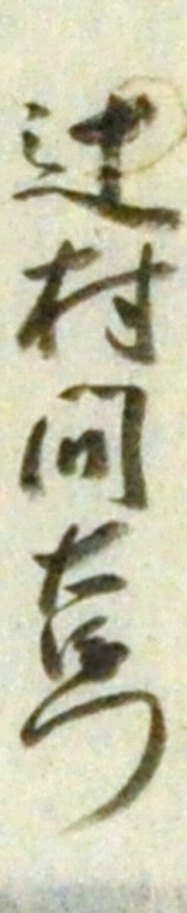辻村間右衛門
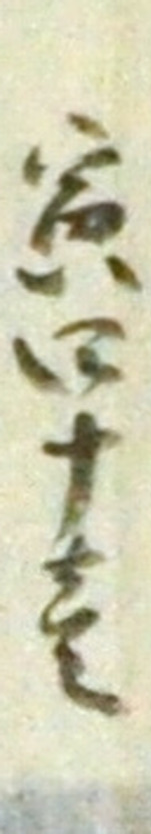寅四十五
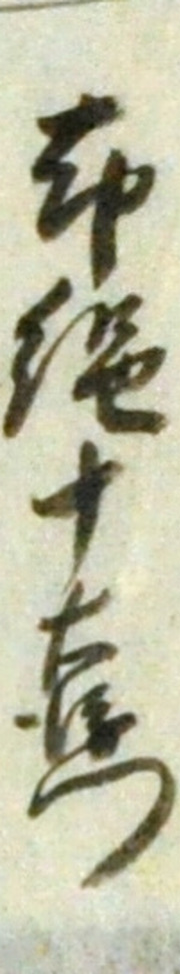布施十右衛門
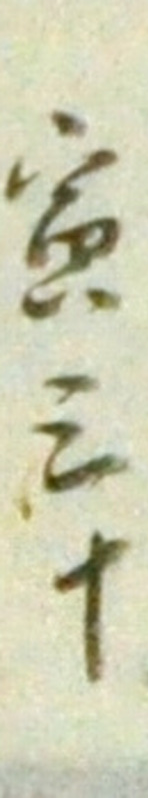寅三十
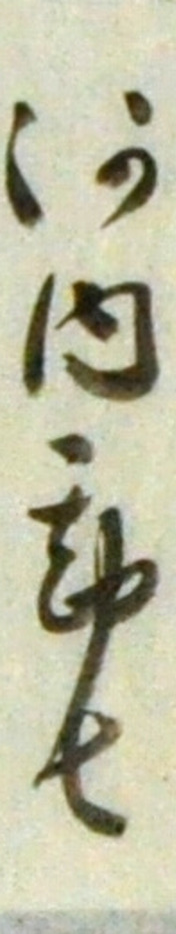河内勘七
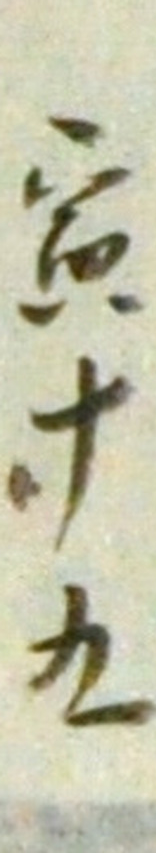寅十九
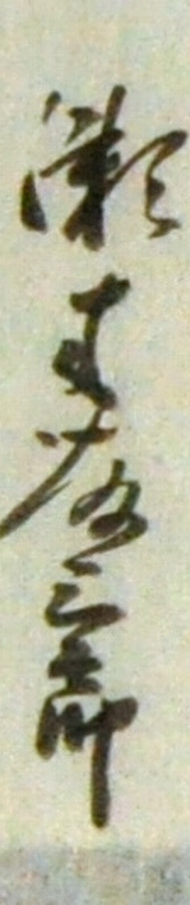瀬木藤三郎
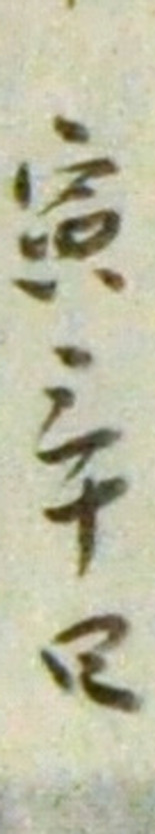寅三十四
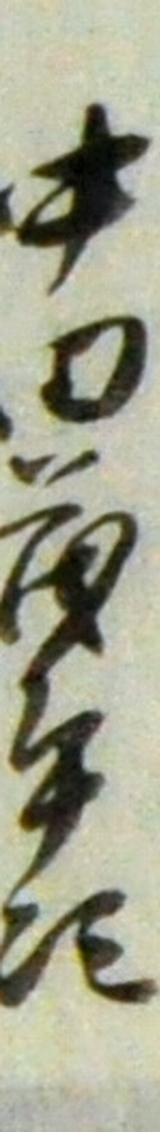中田茂平次

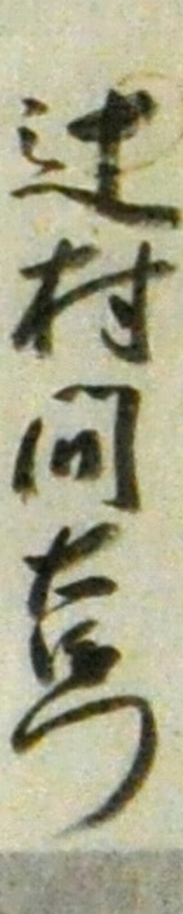辻村間右衛門
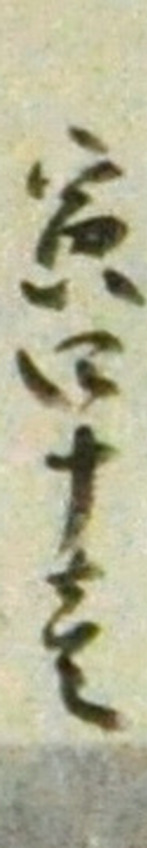寅四十壱
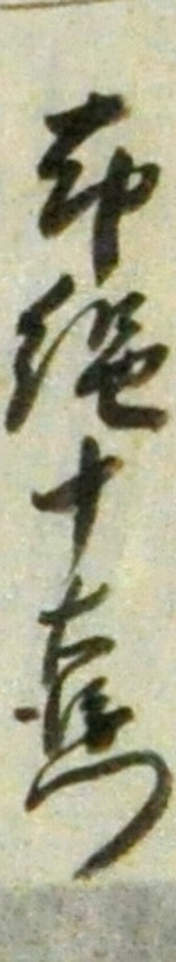布施十右衛門
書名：罪状判決
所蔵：伊那市立高遠町図書館・合同会社AMANE
